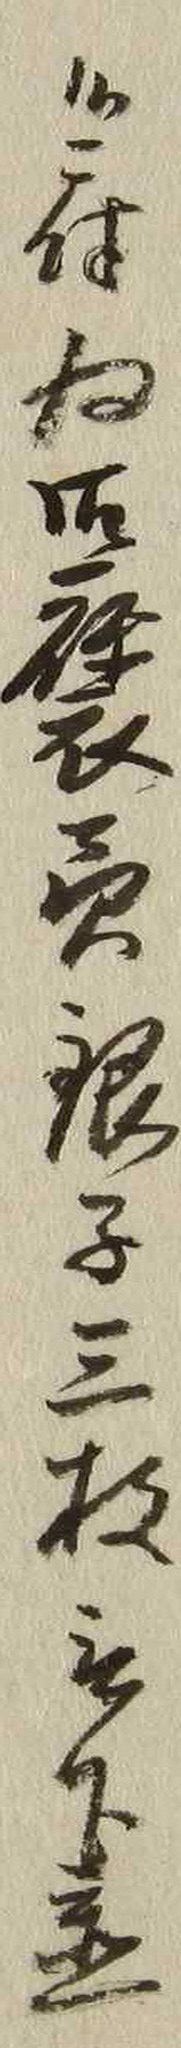候ニ付為御褒美銀子三枚被下置
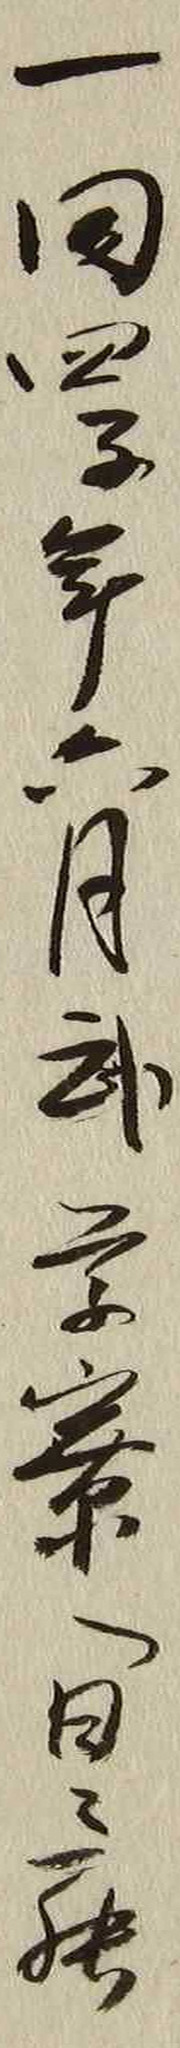一同四子年六月武学寮へ日々罷
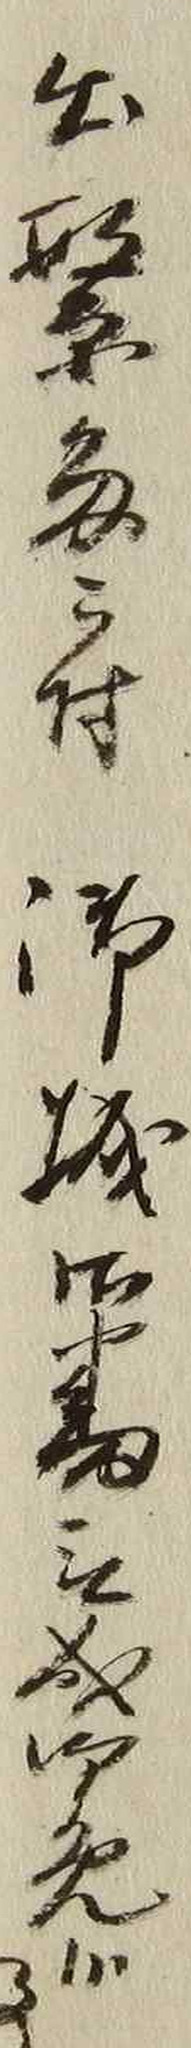出繁多ニ付御城御番被成御免候事
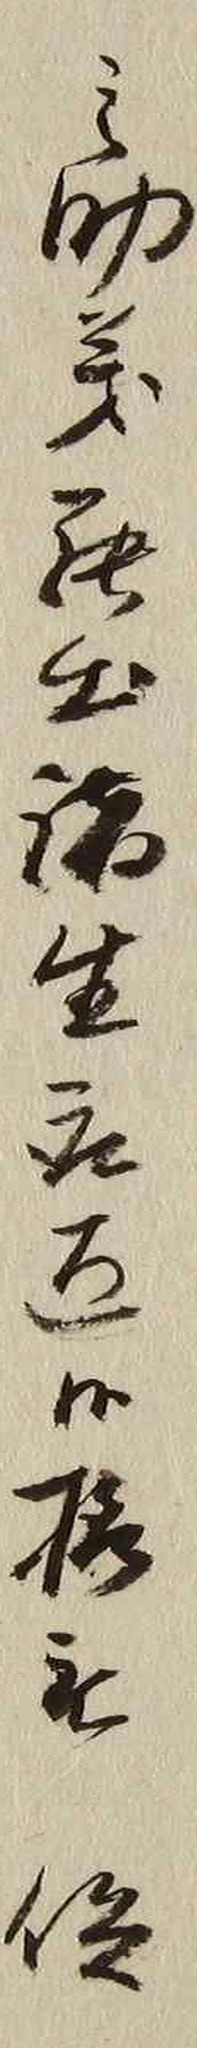之助義罷出諸生取立候様被仰
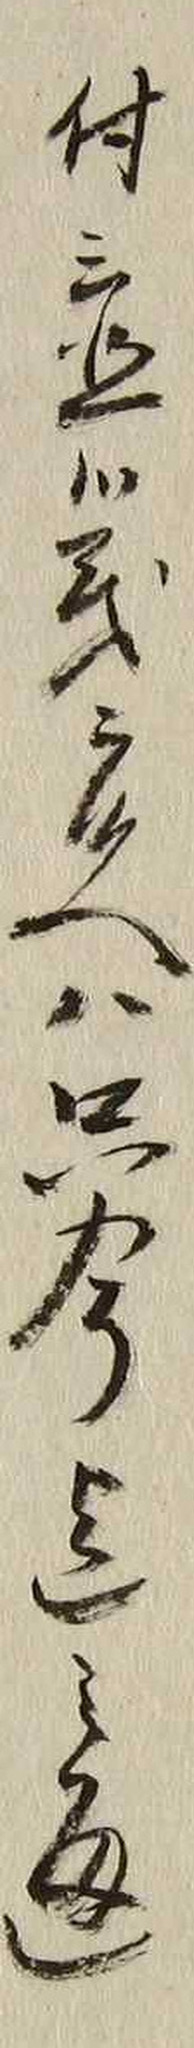付置候義ニ候へハ只今迄之通
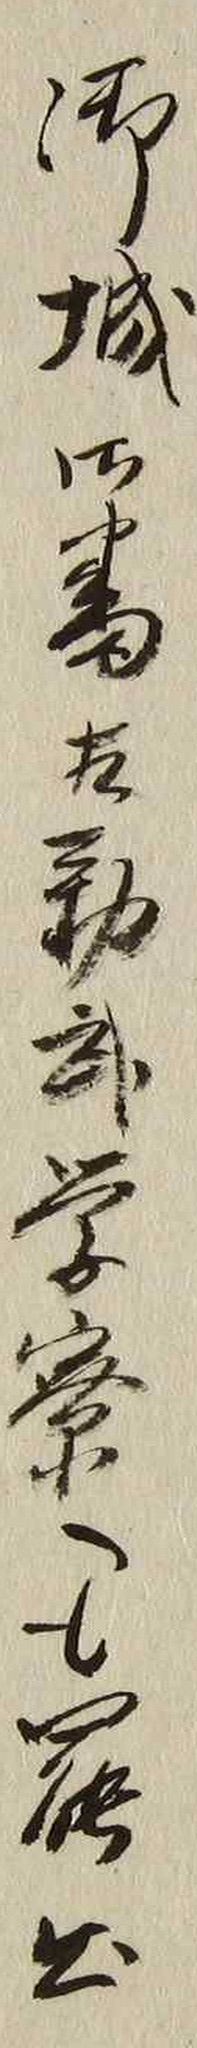御城御番相勤武学寮へも罷出
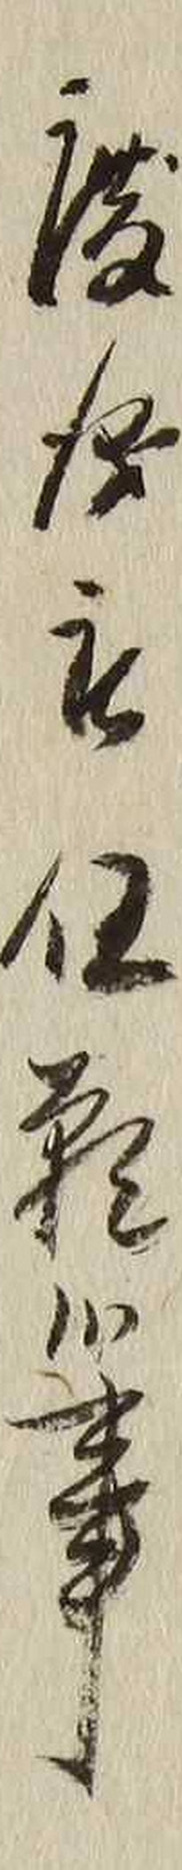度儀被任願候事
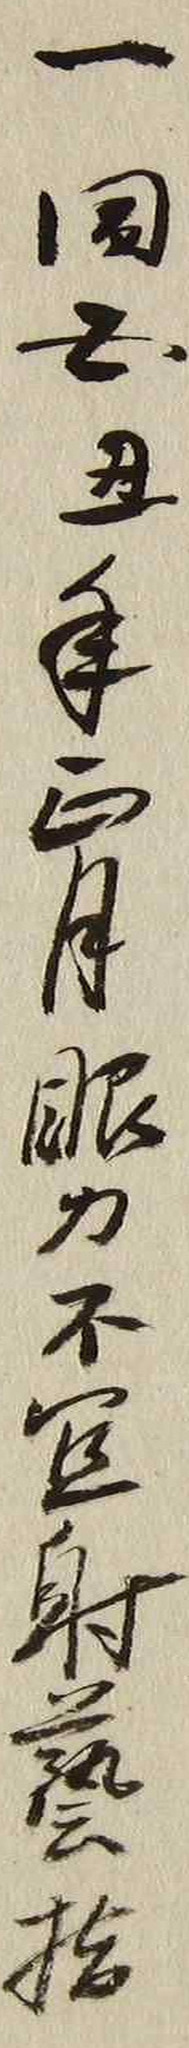一同五丑年正月眼力不宜射芸指
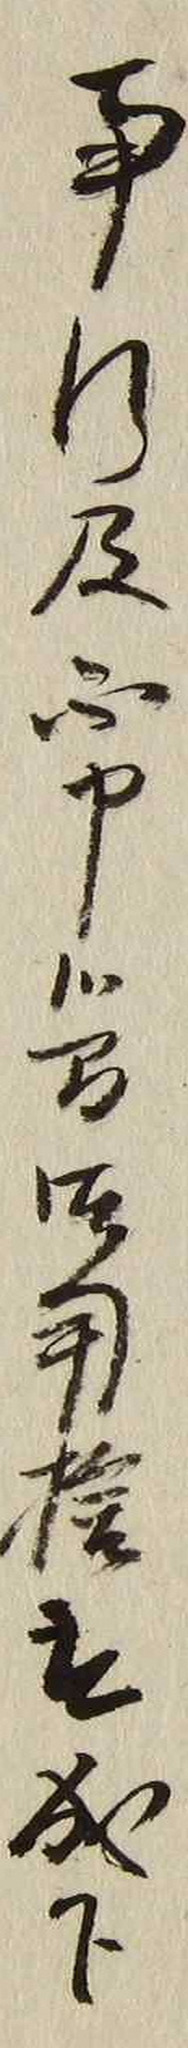南行及不申候間御用捨被成下
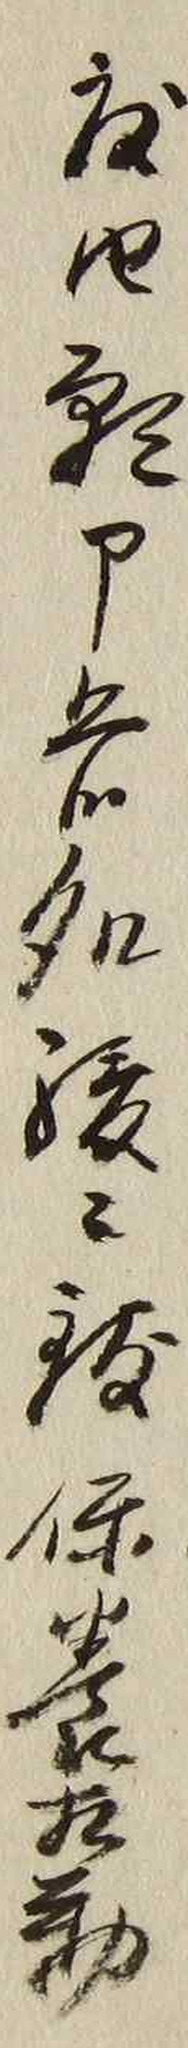度由願申上候処緩々致保養相勤
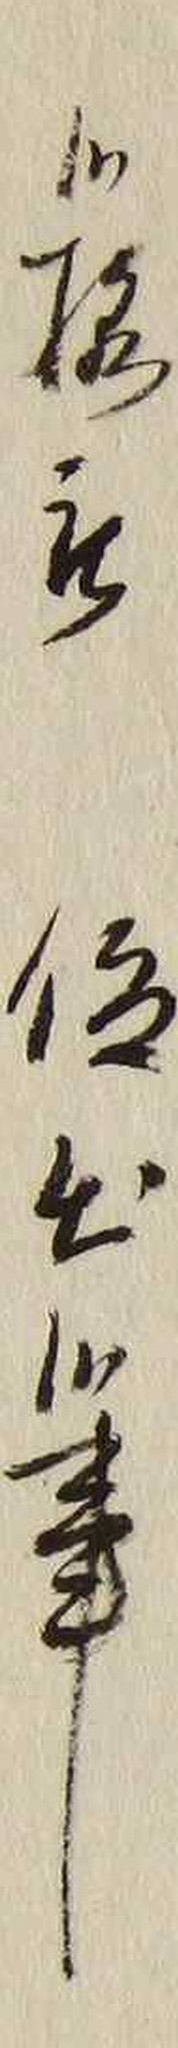候様被仰出候事
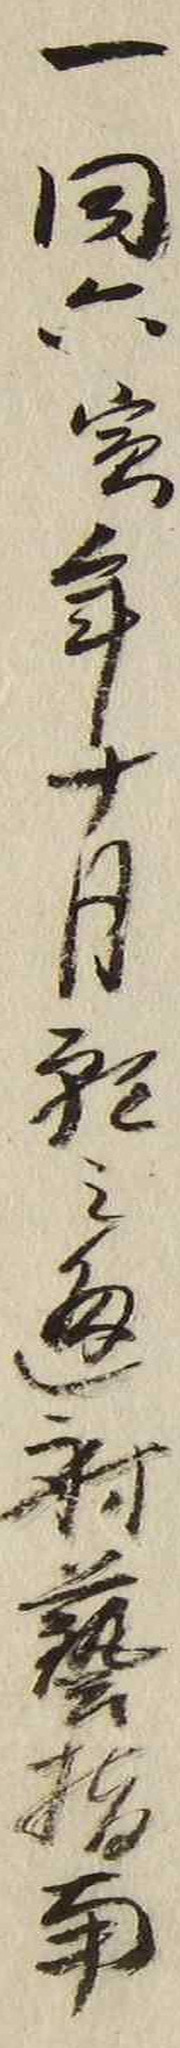一同六寅年十月願之通射芸指南

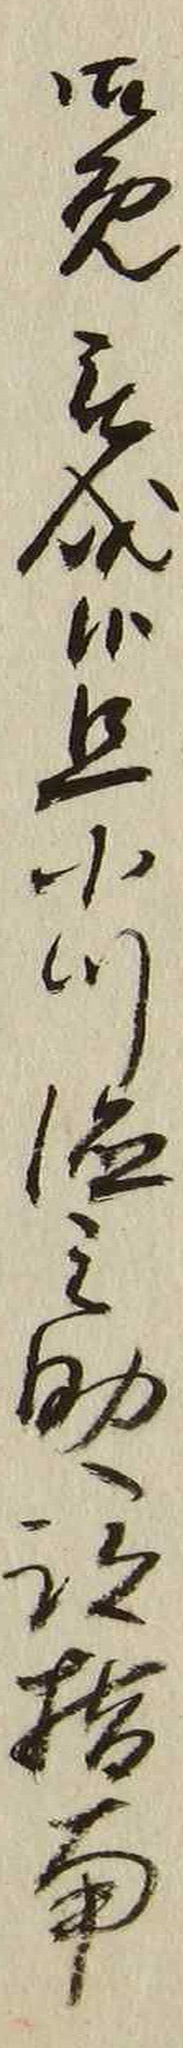御免被成候且小川徳之助へ跡指南
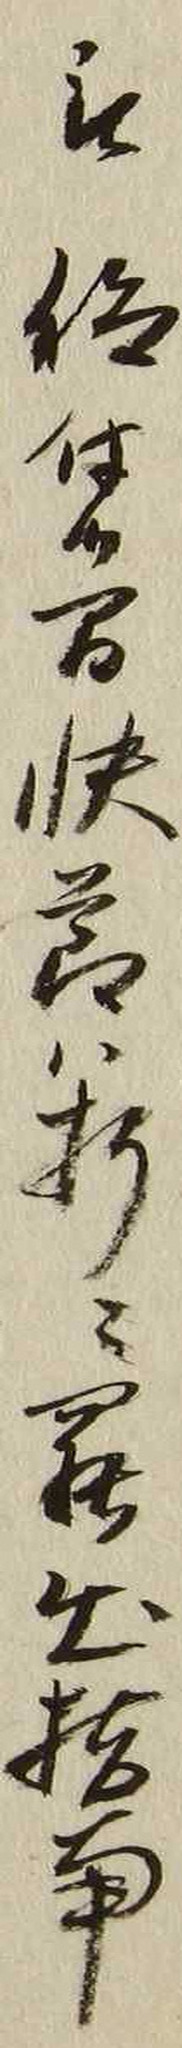被仰付候間快節ハ折々罷出指南
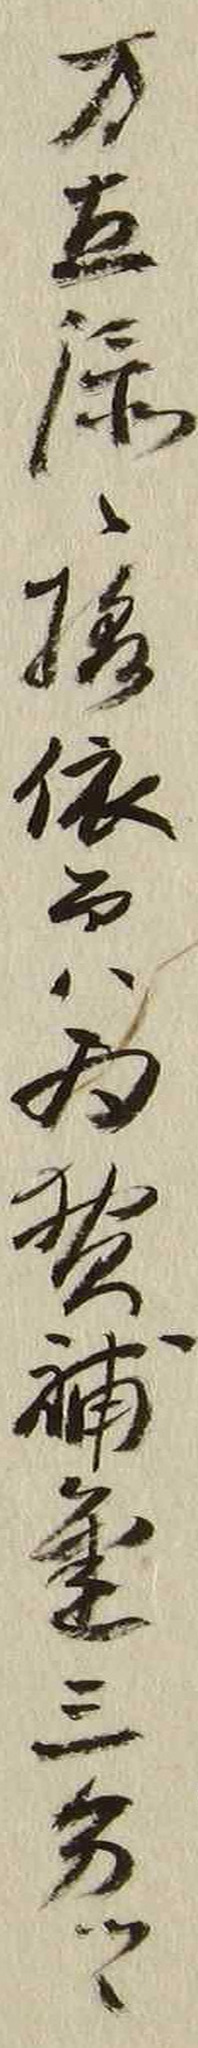方立添候様依而ハ為費補金三分ツヽ
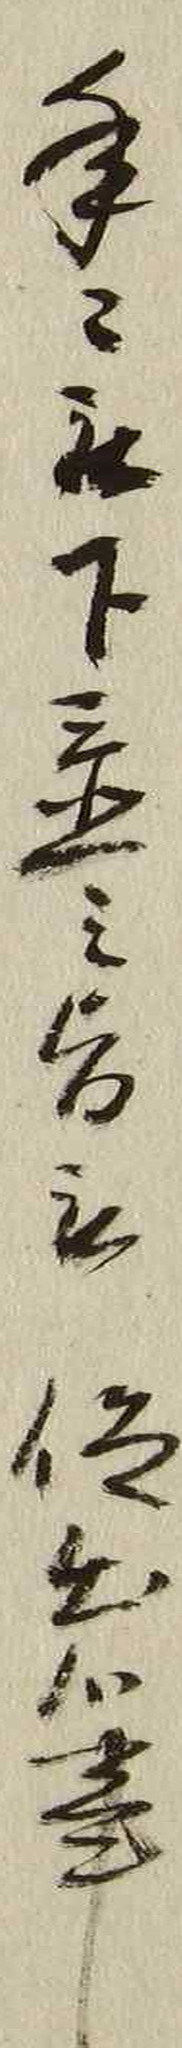年々被下置之旨被仰出候事
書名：諸士系譜　巻之346　も之部2
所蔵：会津若松市立会津図書館
